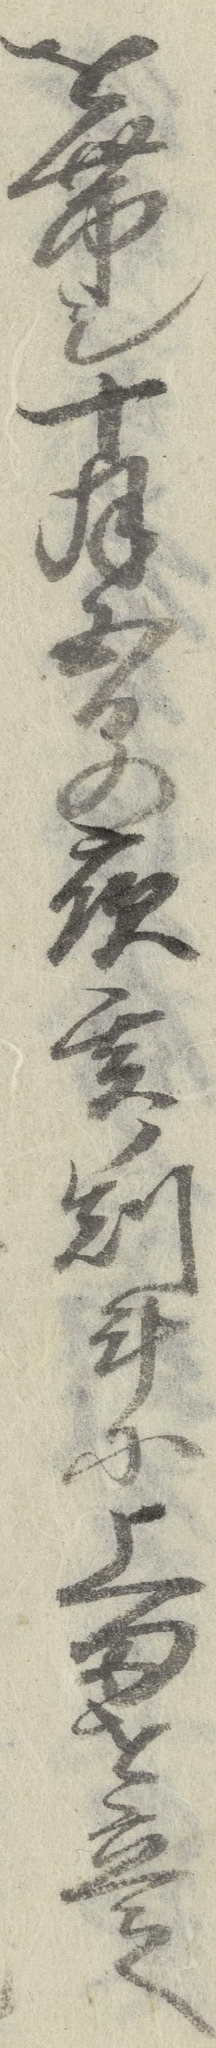を帯シ十月五日の夜亥ノ刻計に上田を立て
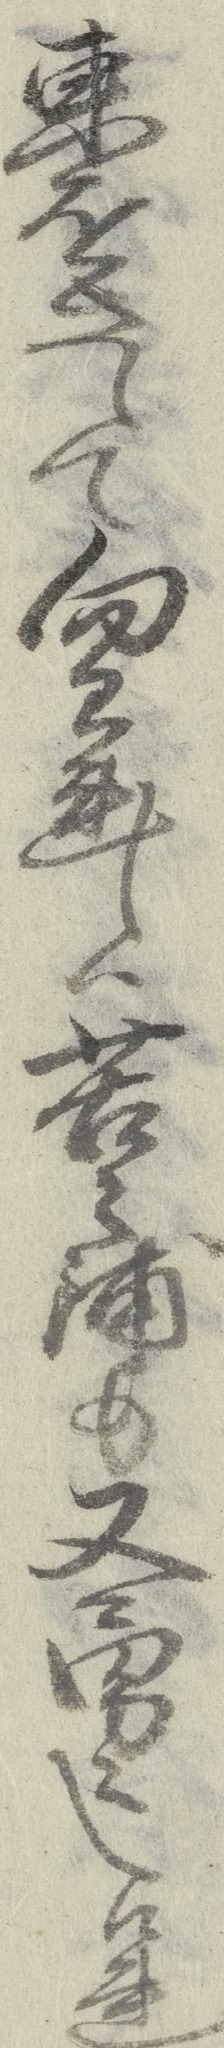東をさして向われしは苦々鋪も又勇々しけれ
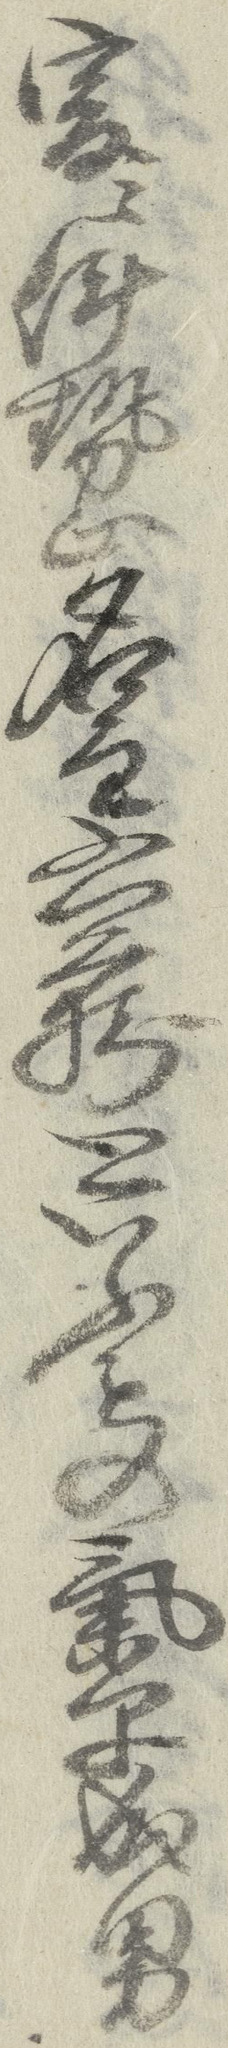爰に伊勢山名主六蔵といふもの気早成男
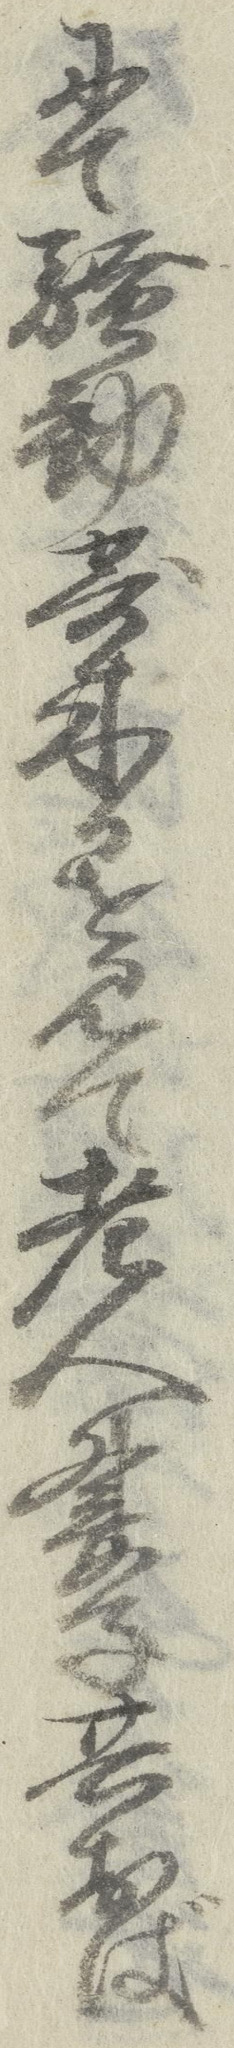にて騒動寄来るを見て老人妻子共おば
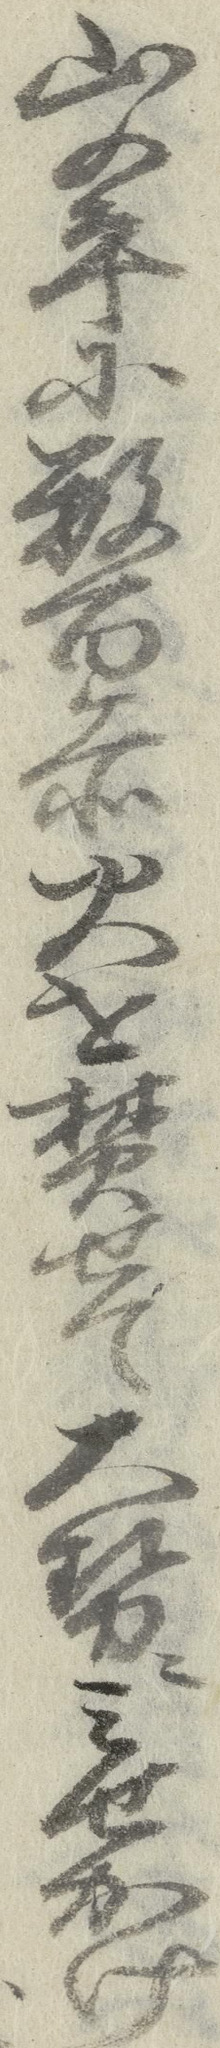山の平に数百ケ所火を焚せて大勢にみせかけ
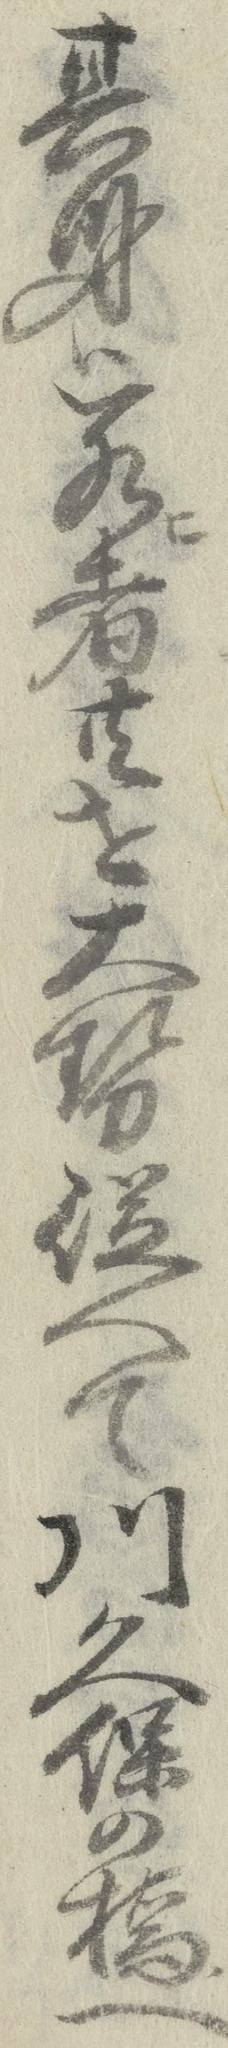其身は若者共を大勢従へて川久保の橋

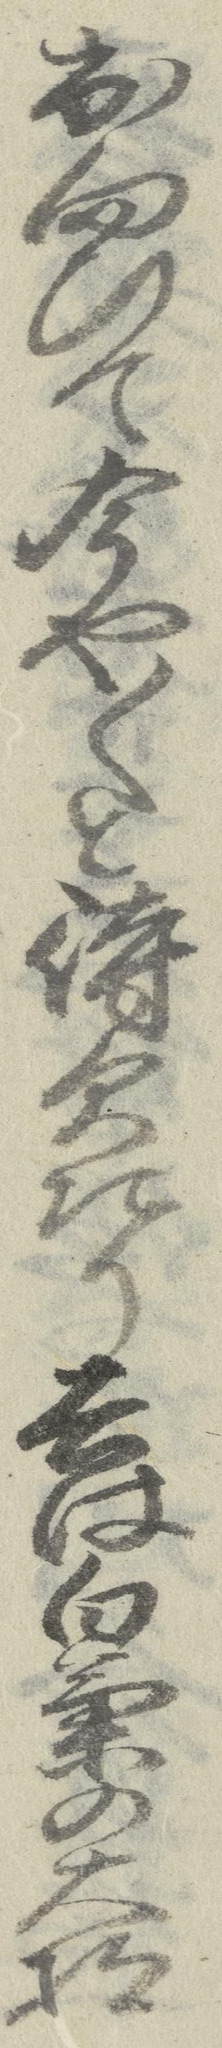出向ひて今や〳〵と待欠たり去は白菊の大将
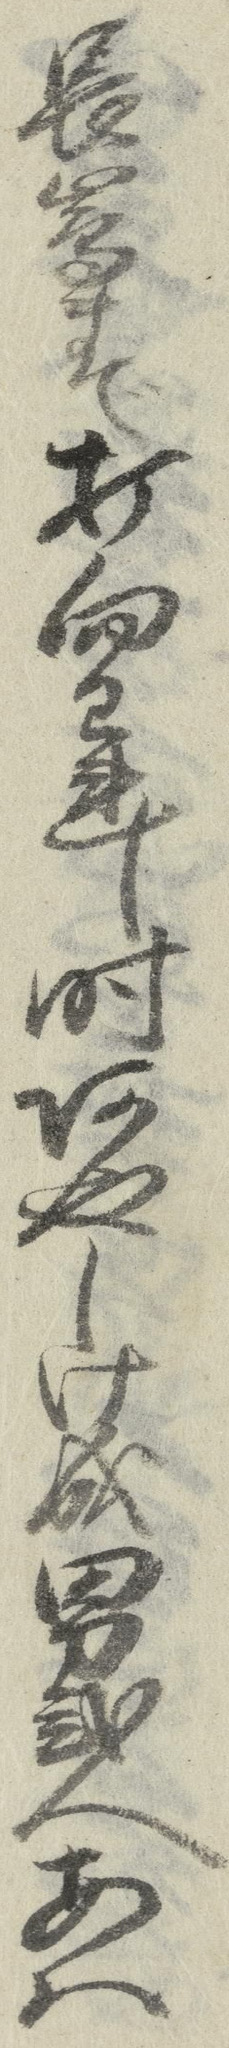長嶋まで打向われし時あやしけ成男弐人あは
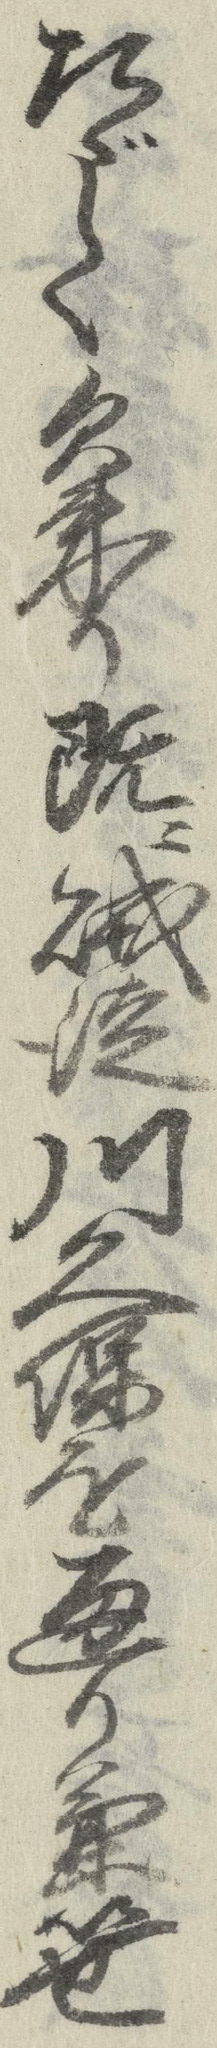たゞしく欠来り既に賊徒川久保を通り兼笹
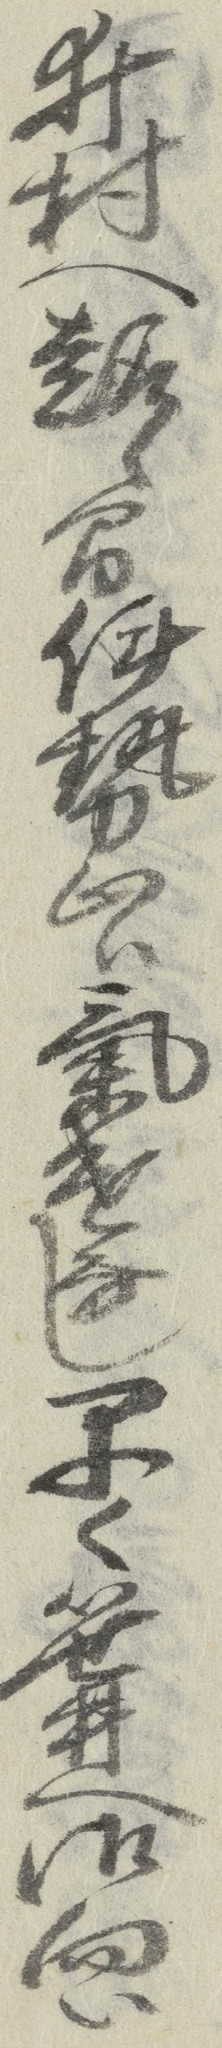井村へ趣候間伊勢山は気遣なし早く笹井へ御向い
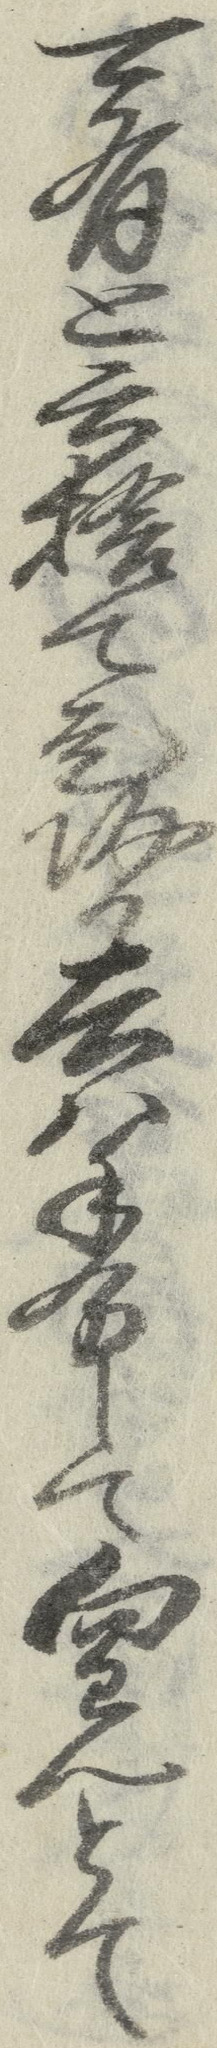可有と云捨て走帰り去は手分して向わんとて
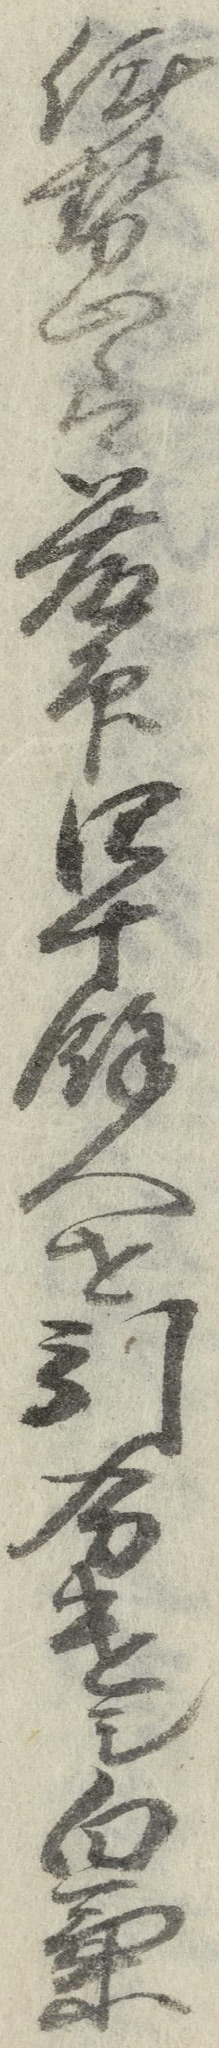伊勢山は藤印四十餘人を引分遣シ白菊
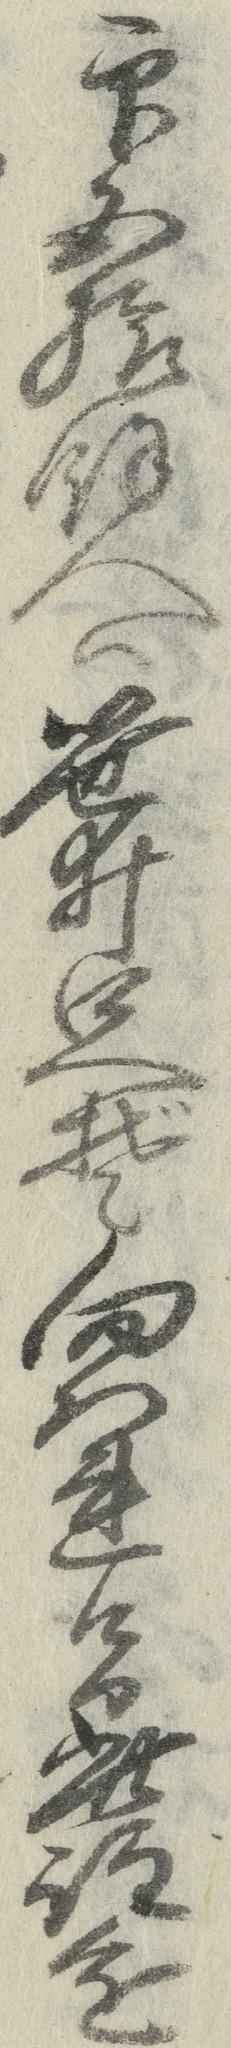印五拾餘人は笹井口へぞ向はれける此注進
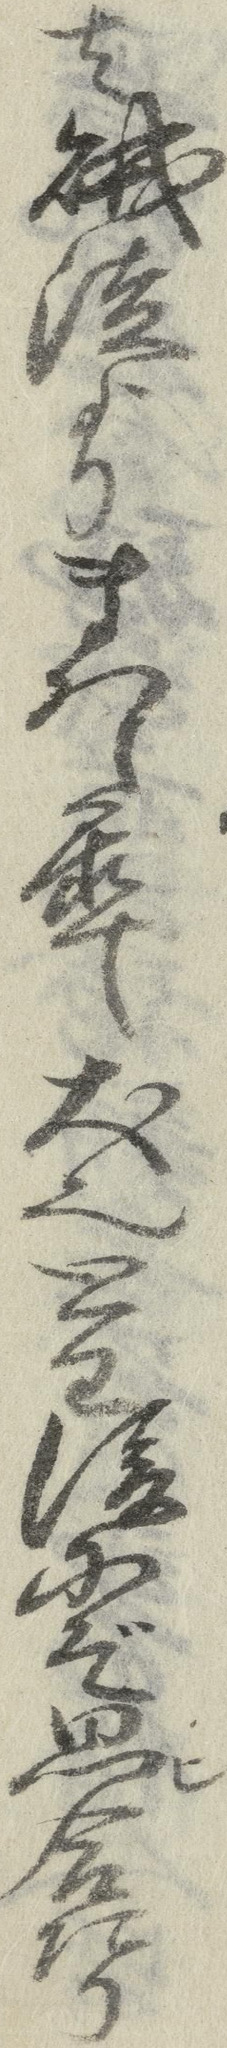は賊徒よりまはし置て犬也とわ後にぞ思合たり
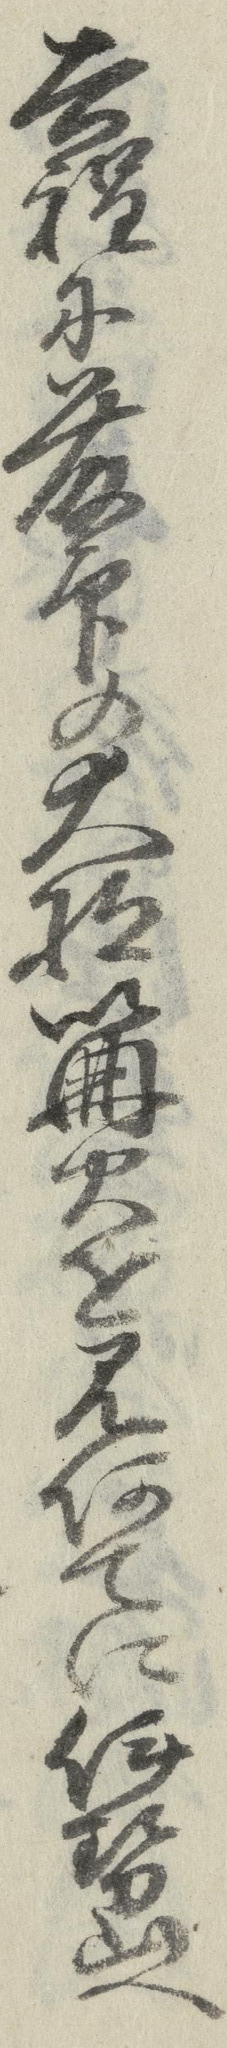去程に藤印の大将篝火を見あてに伊勢山へ
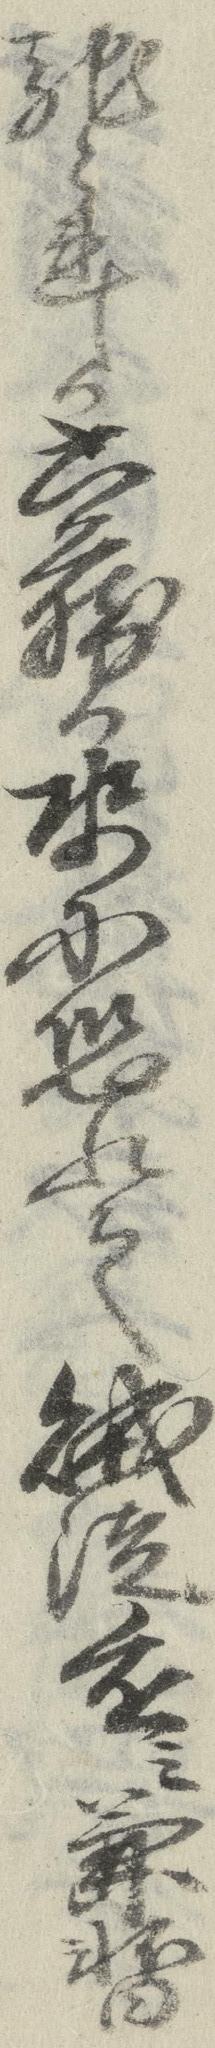馳られしか六蔵か決に恐れて賊徒進み兼暫
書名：浅間大焼騒動記　下
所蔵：東京大学地震研究所図書室 Earthquake Research Institute Library, The University of Tokyo, JAPAN
